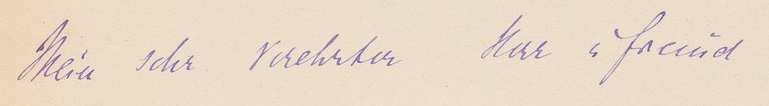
Mein sehr verehrter Herr u Freund
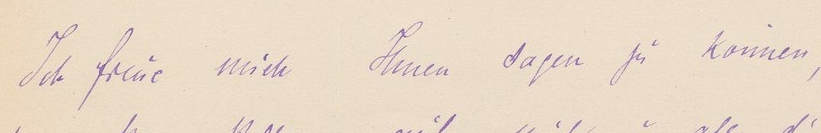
Ich freue mich Ihnen sagen zu können,
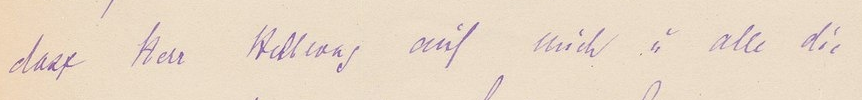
daß Herr Hellwag auf mich u alle die
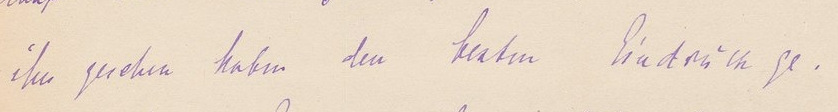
ihn gesehen haben den besten Eindruck ge-
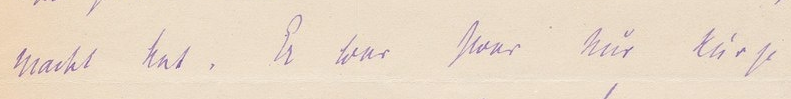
macht hat. Er war zwar nur kurze
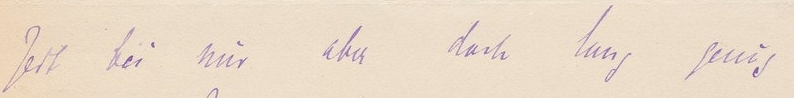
Zeit bei mir aber doch lang genug
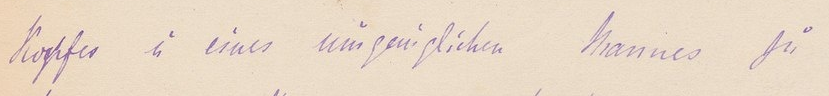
Kopfes u eines umgänglichen Mannes zu
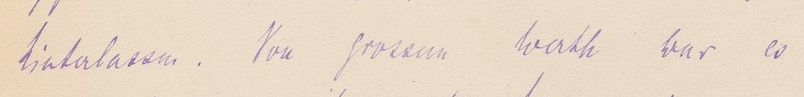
hinterlassen. Von grossem Werth war es
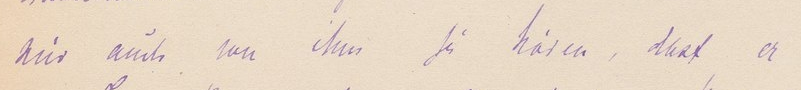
mir auch von ihm zu hören, dass er
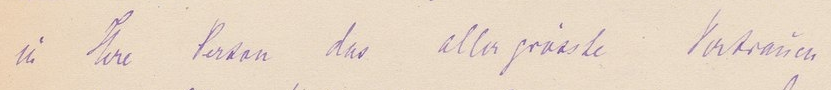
in Ihre Person das allergrösste Vertrauen
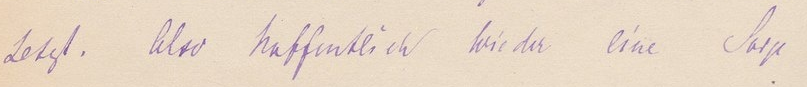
setzt. Also hoffentlich wieder eine Sorge
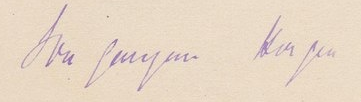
Von ganzem Herzen
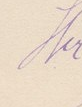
Ihr
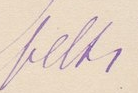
Welti
